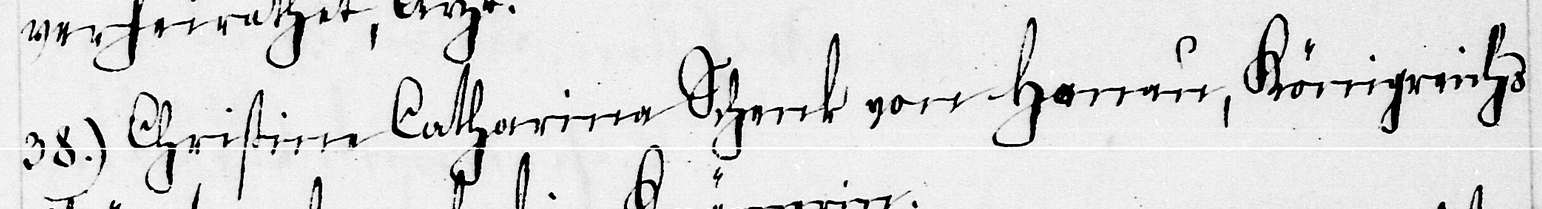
38.) Christine Catharina Schenk von Hanau, Königreichs
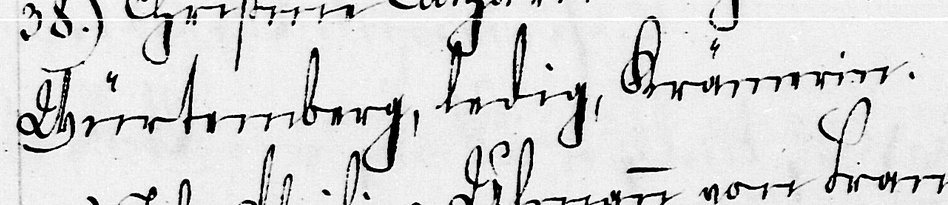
Würtemberg, ledig, Krämerin.
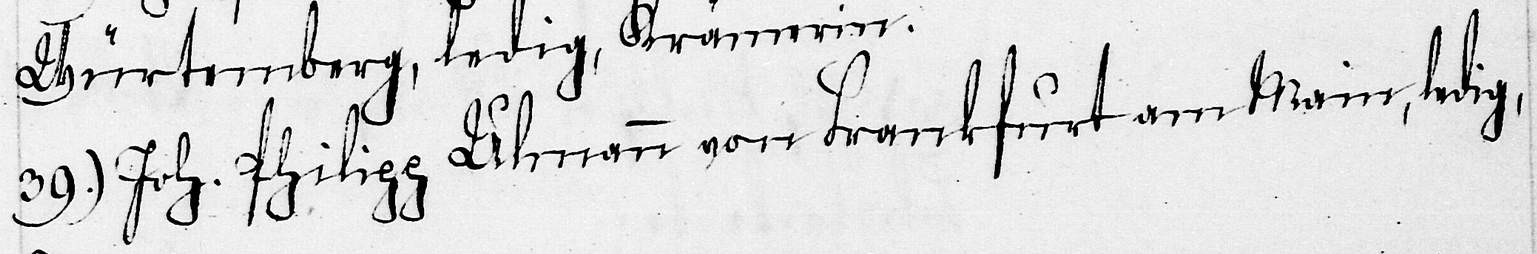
39.) Joh. Philipp Ulmann von Frankfurt am Main, ledig,
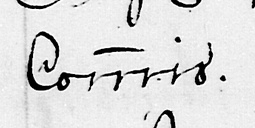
Commis.
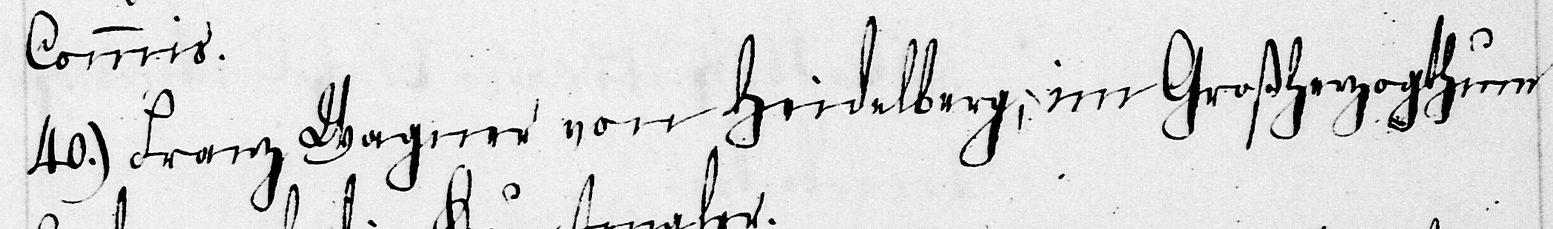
40.) Franz Wagner von Heidelberg, im Großherzogthum
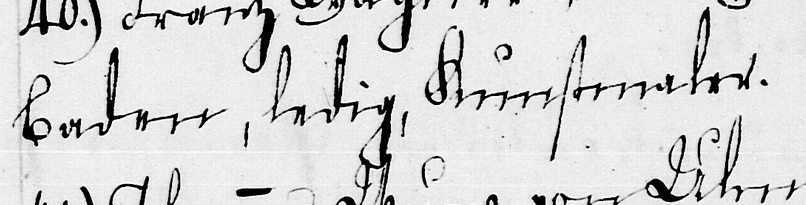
Baden, ledig, Kunstmaler.
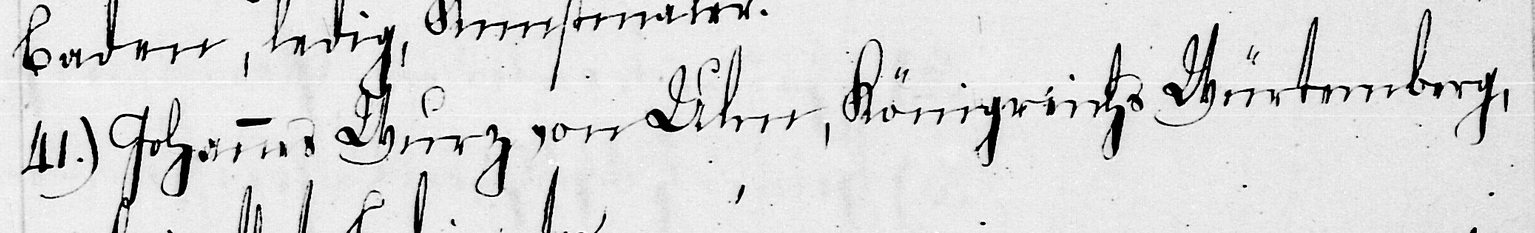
41.) Johannes Wurz von Ulm, Königreichs Würtemberg,
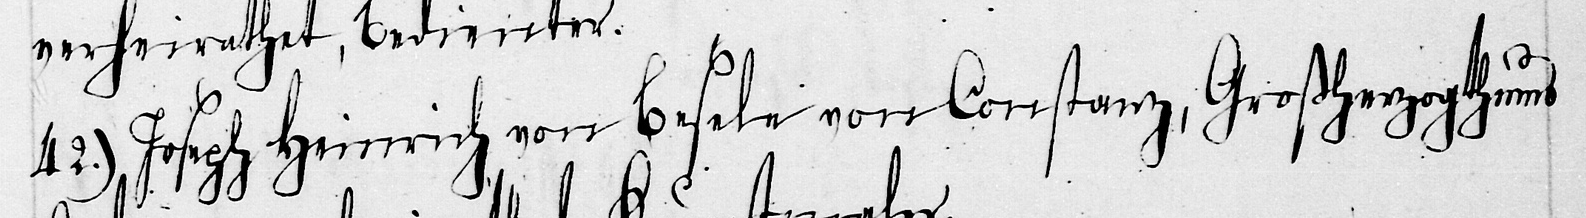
42.) Joseph Heinrich von Besele von Constanz, Großherzogthums
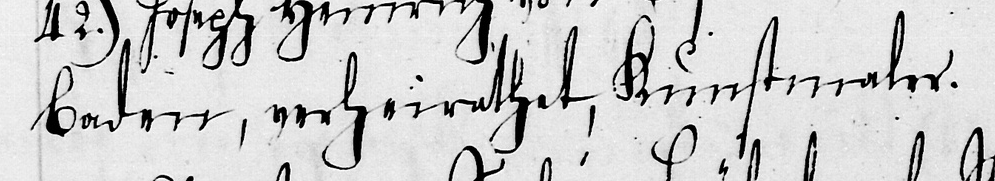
Baden, verheirathet, Kunstmaler.
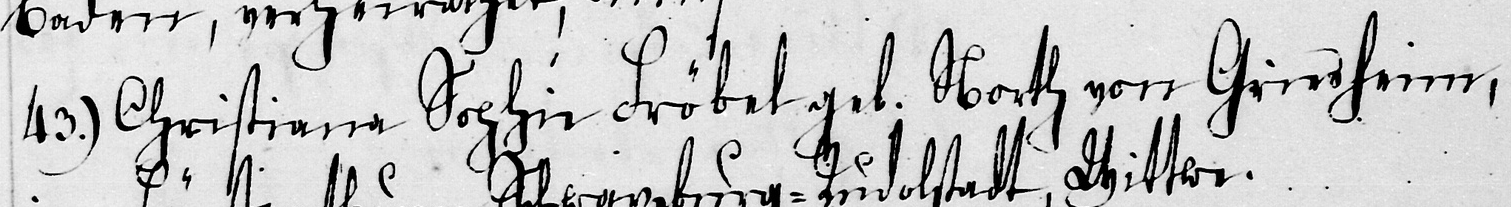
43.) Christiana Sophie Fröbel geb. North von Griesheim,
